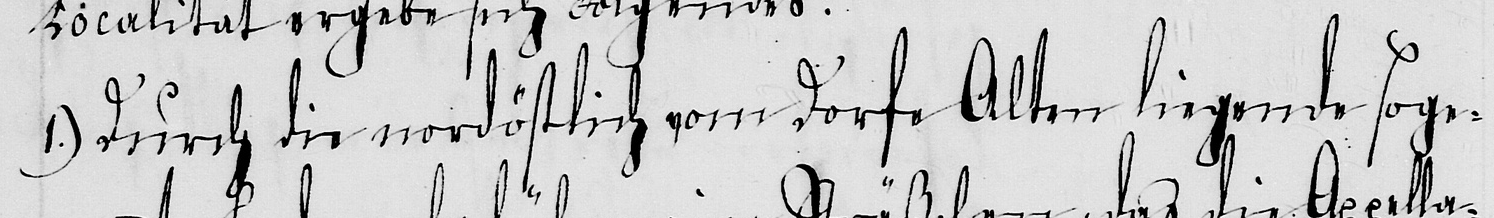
1.) Durch die nordöstlich vom Dorfe Alten liegende soge¬
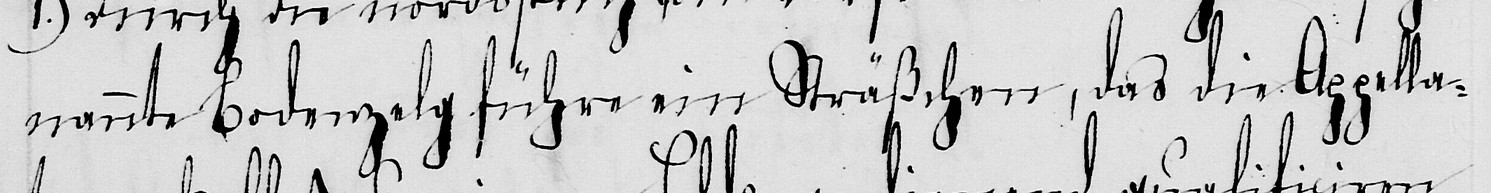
nannte Bodenzelg führe ein Sträßchen, das die Appella¬
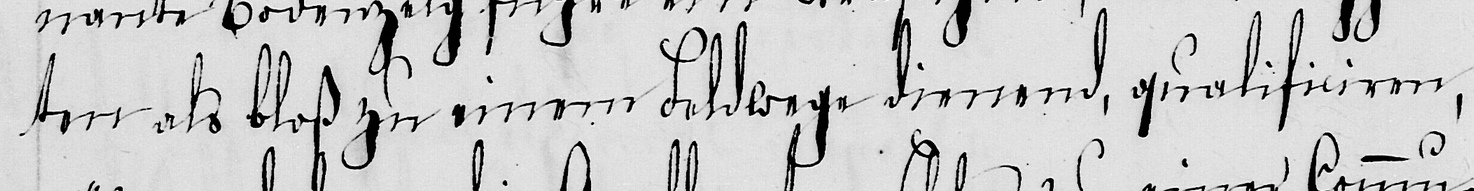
ten als bloß zu einem Feldwege dienend, qualificiren,
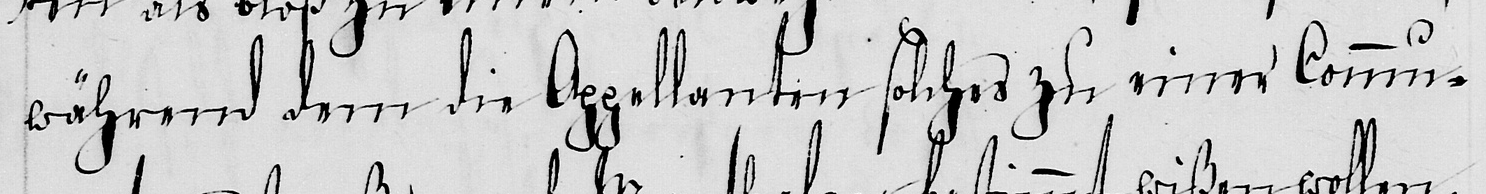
während dem die Appellanten solches zu einer Commu¬
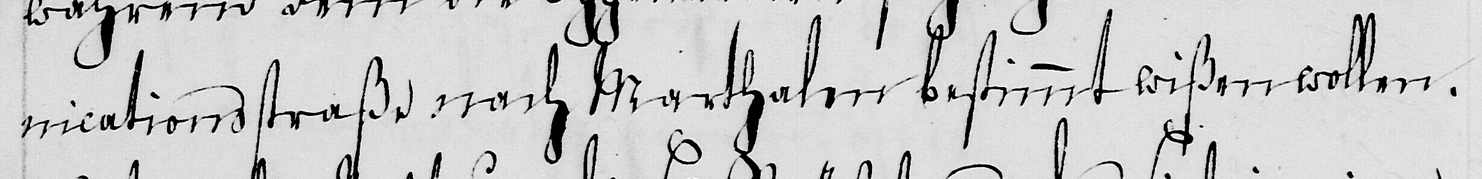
nicationsstraße nach Marthalen bestimmt wißen wollen.
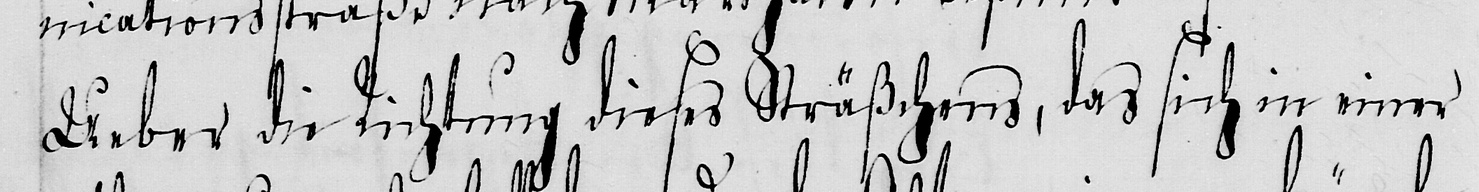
Ueber die Richtung dieses Sträßchens, das sich in einer
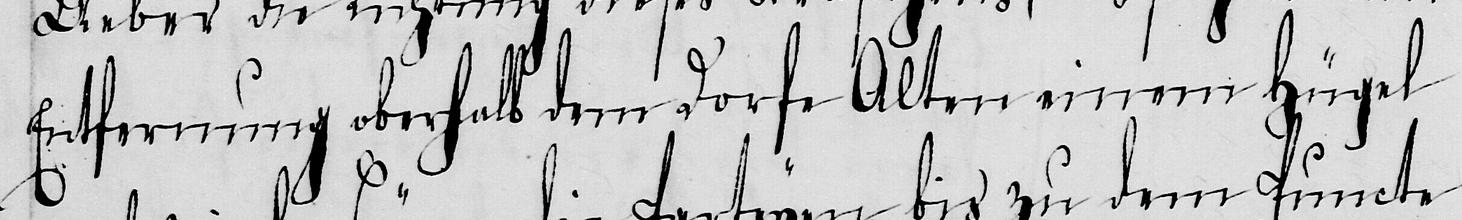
Entfernung oberhalb dem Dorfe Alten einem Hügel
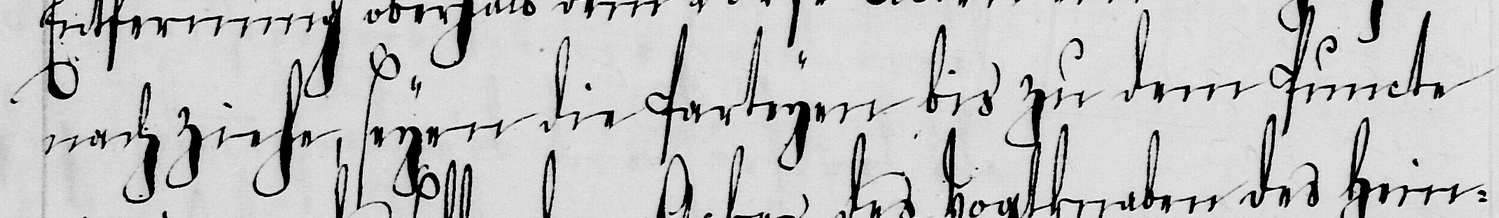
nach ziehe, seyen die Parteyen bis zu dem Puncte
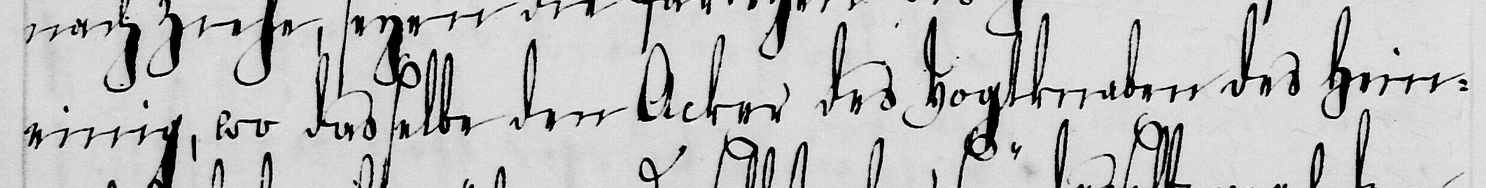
einig, wo dasselbe den Acker des Vogtknaben des Hein¬
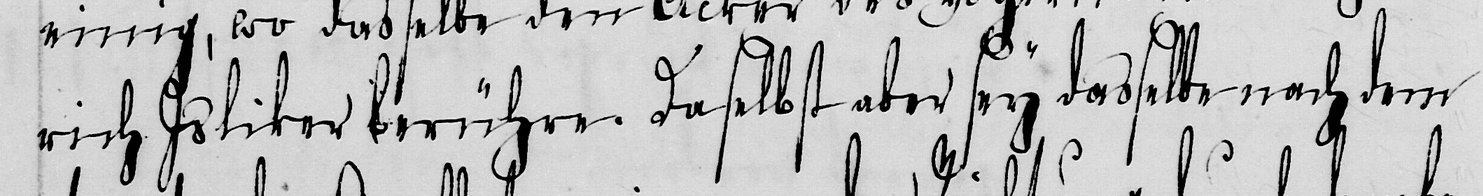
rich Isliker berühre. Daselbst aber sey dasselbe nach dem
